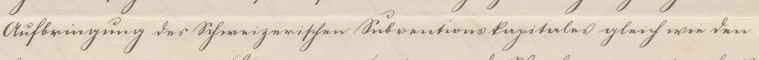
Aufbringung des Schweizerischen Subventionskapitales gleich wie den
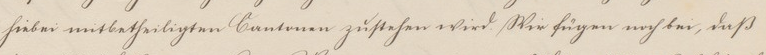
hiebei mitbetheiligten Cantonen zustehen wird. Wir fügen noch bei, daß
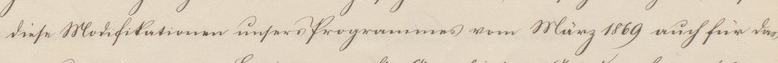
diese Modifikationen unsers Programmes vom März 1869 auch für das
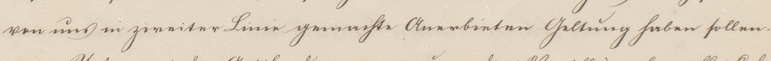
von uns in zweiter Linie gemachte Anerbieten Geltung haben sollen.
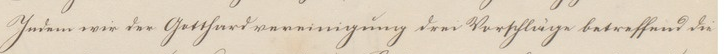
Indem wir der Gotthardvereinigung drei Vorschläge betreffend die
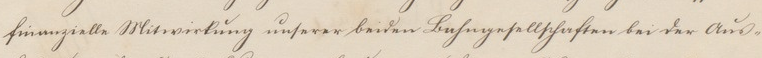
finanzielle Mitwirkung unserer beiden Bahngesellschaften bei der Aus-
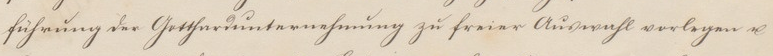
führung der Gotthardunternehmung zu freier Auswahl vorlegen &
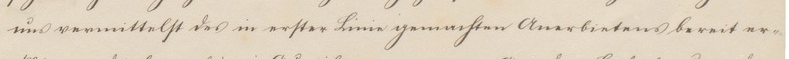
uns vermittelst des in erster Linie gemachten Anerbietens bereit er-
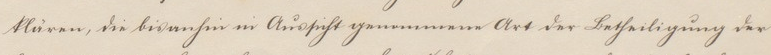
klären, die bisanhin in Aussicht genommene Art der Betheiligung der
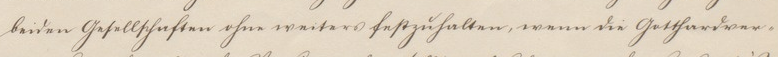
beiden Gesellschaften ohne weiters festzuhalten, wenn die Gotthardver-
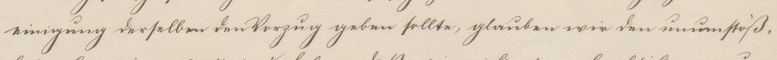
einigung derselben den Vorzug geben sollte, glauben wir den unumstöß-
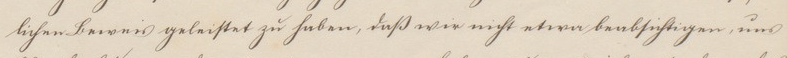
lichen Beweis geleistet zu haben, daß wir nicht etwa beabsichtigen, uns
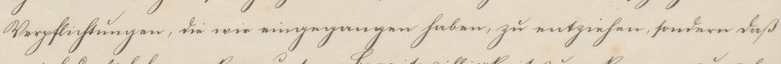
Verpflichtungen, die wir eingegangen haben, zu entziehen, sondern daß
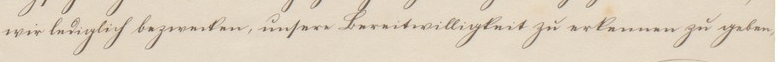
wir lediglich bezwecken, unsere Bereitwilligkeit zu erkennen zu geben,
